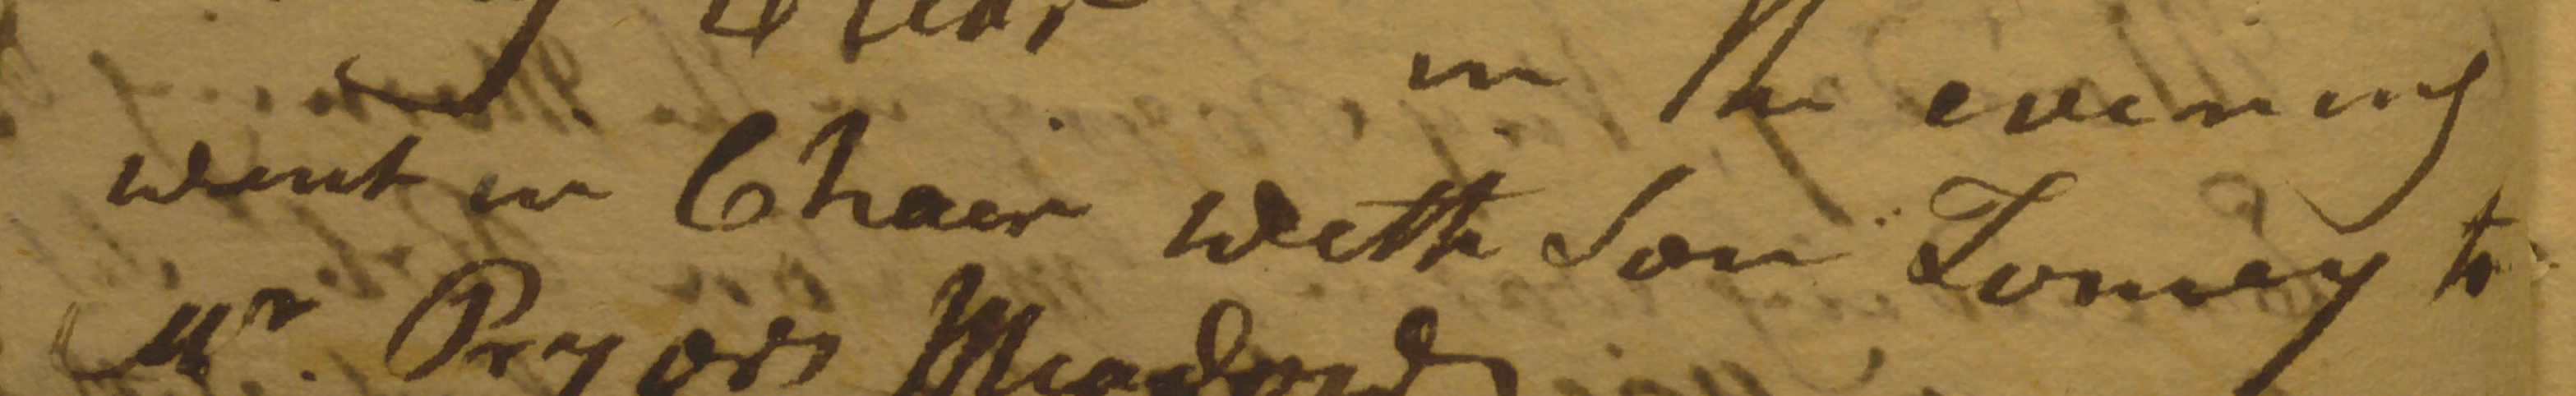went in Chair with son Tomey to
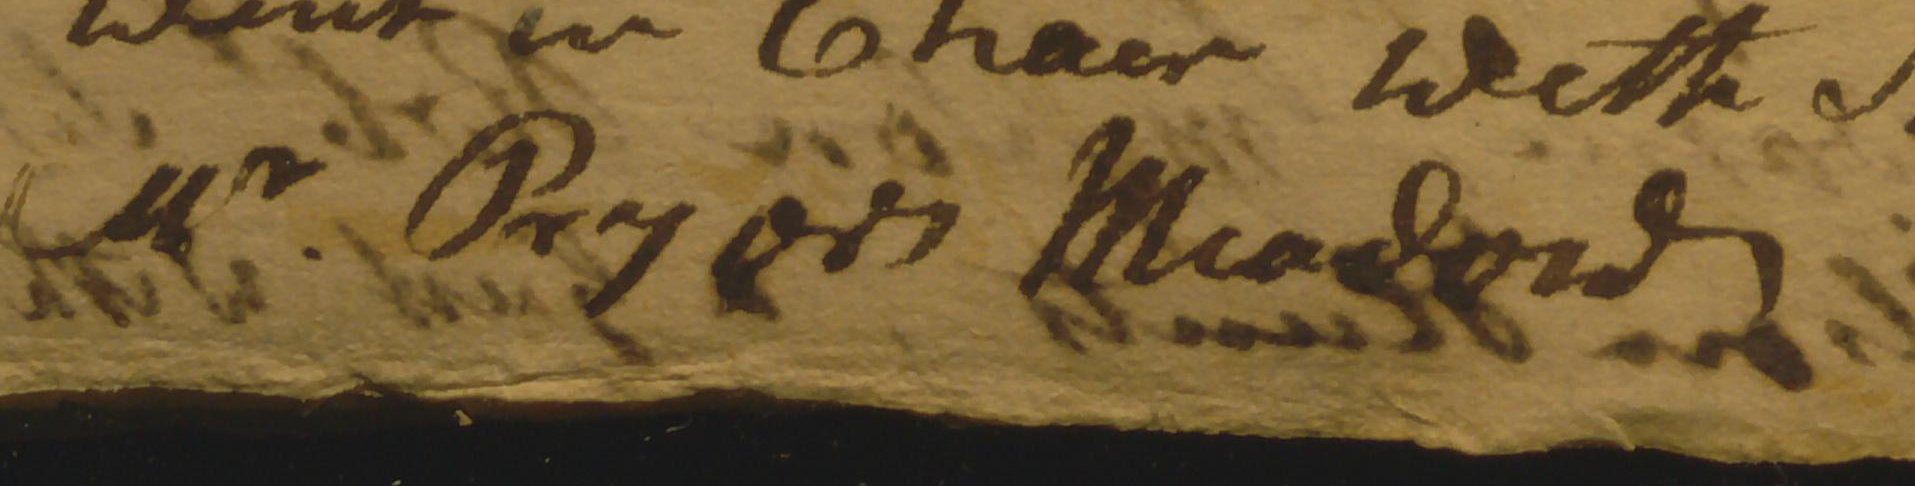M^r. Pryors Meadow
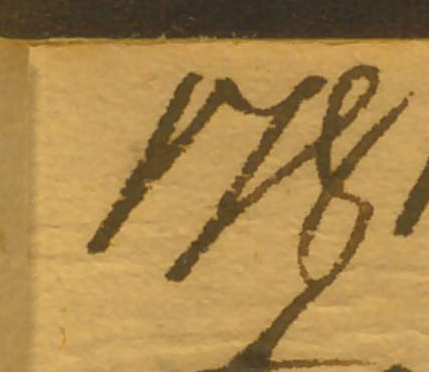1781
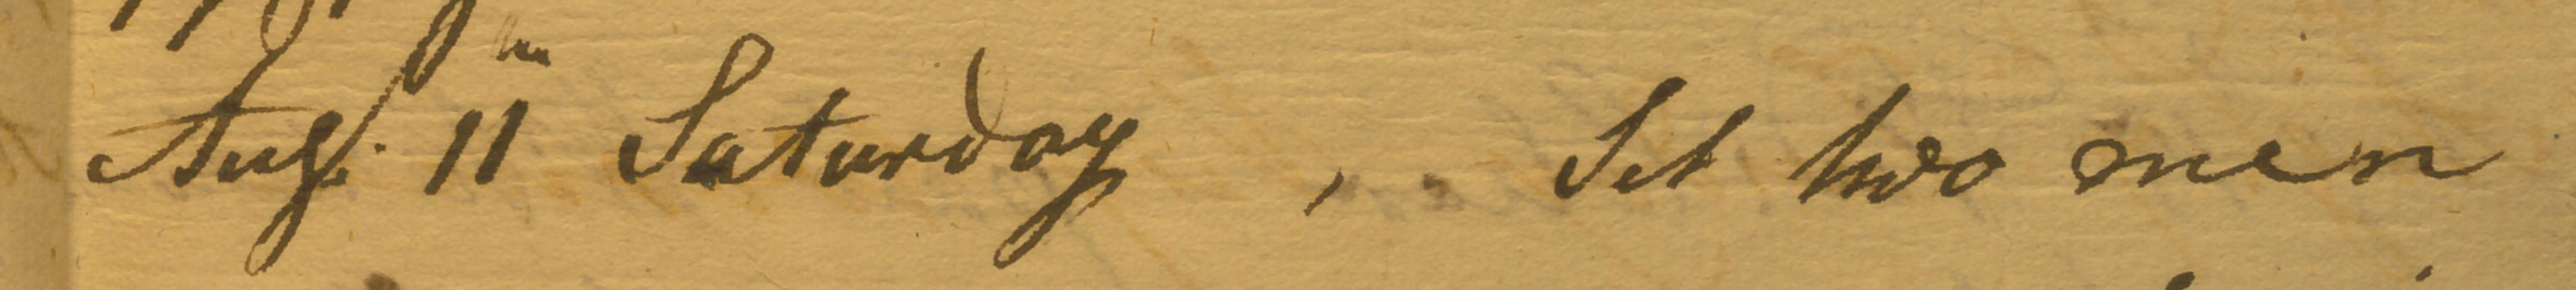Aug^t. 11^th Saturday, Set two men
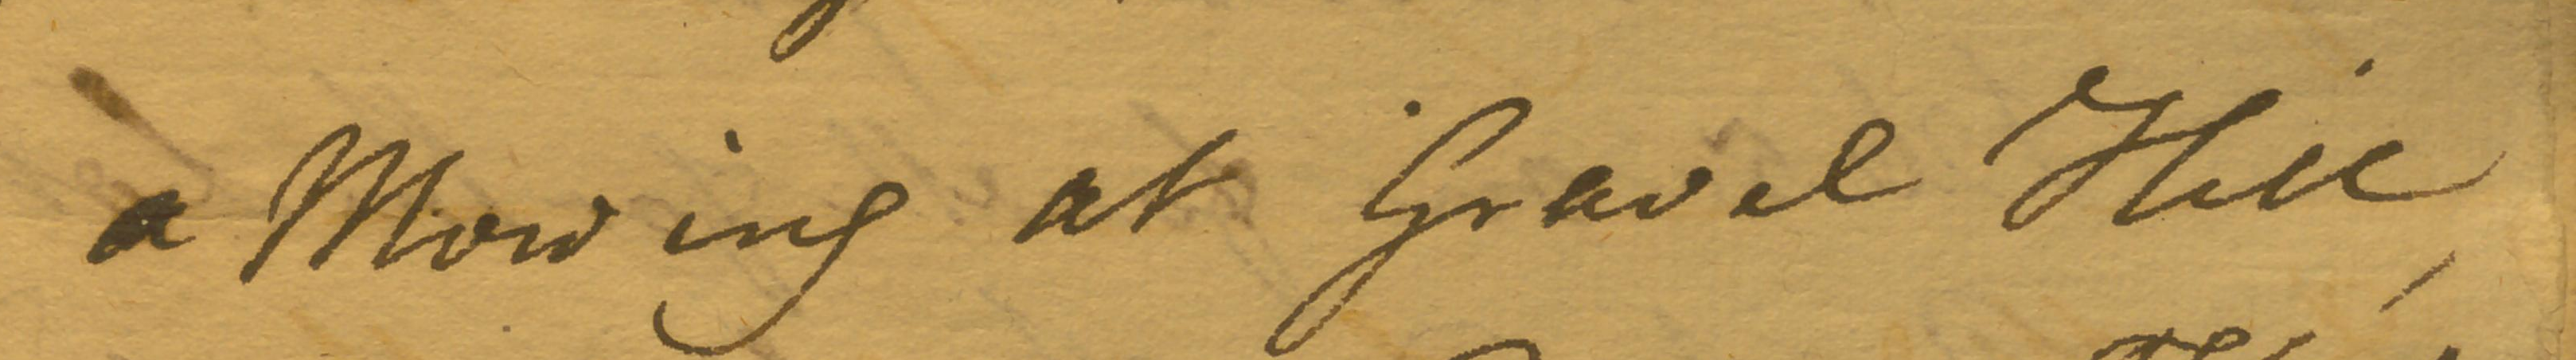a Mowing at Gravel Hell
